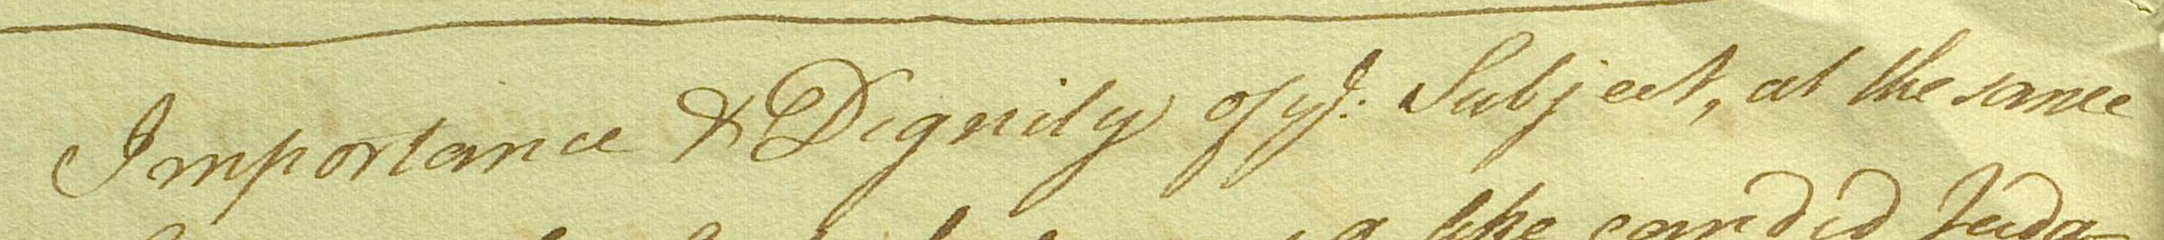Importance & Dignity of y^e: Subject, at the same
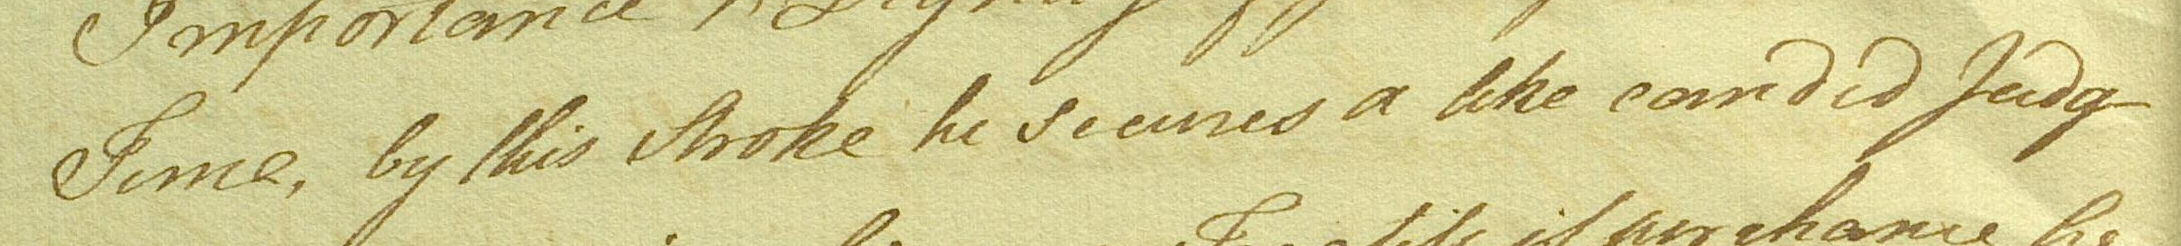time, by this Stroke he secures a like candid Judg
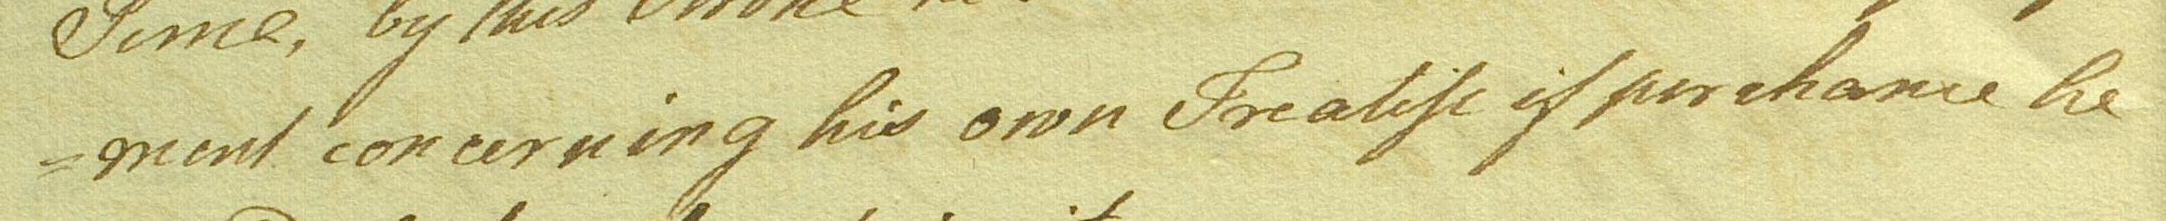-ment concerning his own Treatise if perchance he
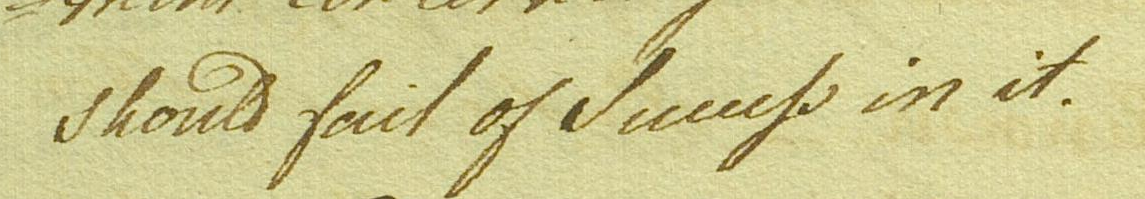should fail of Success in it.
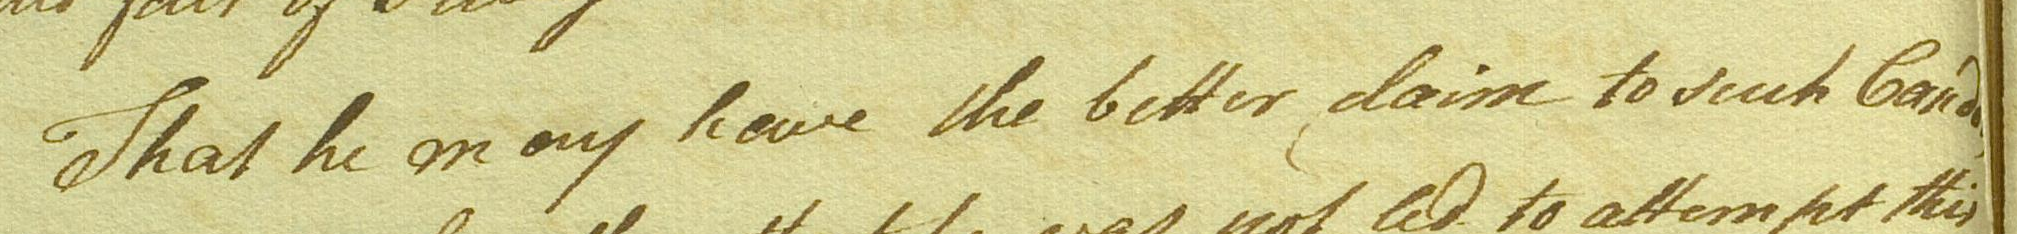That he may have the better claim to such Candor
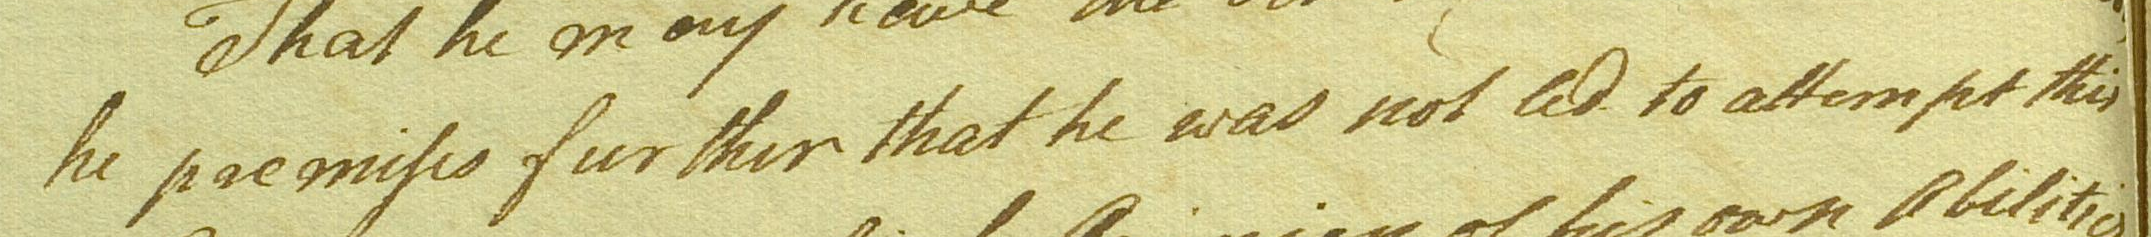he premises further that he was not led to attempt this
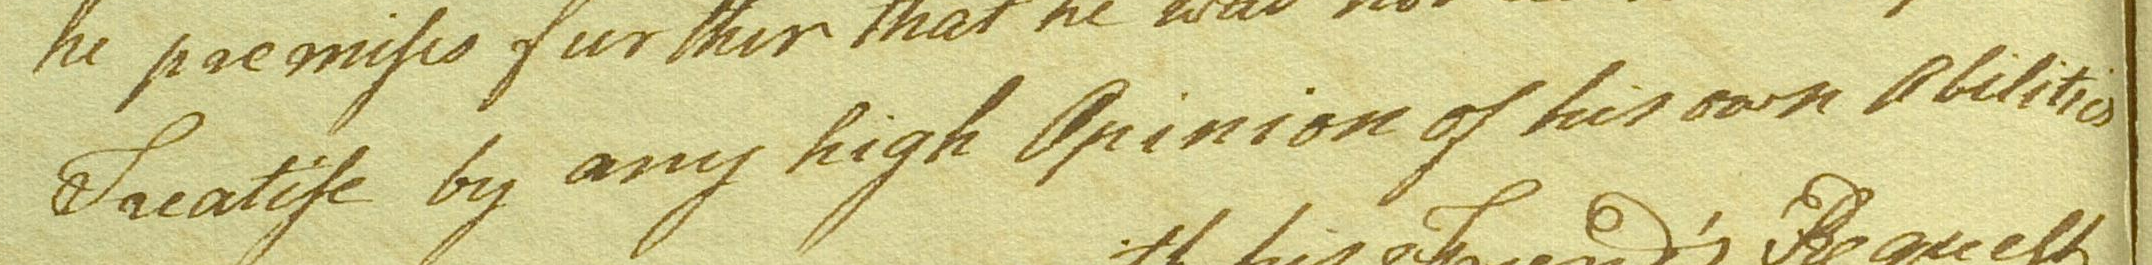Treatise by any high Opinion of his own Abilities
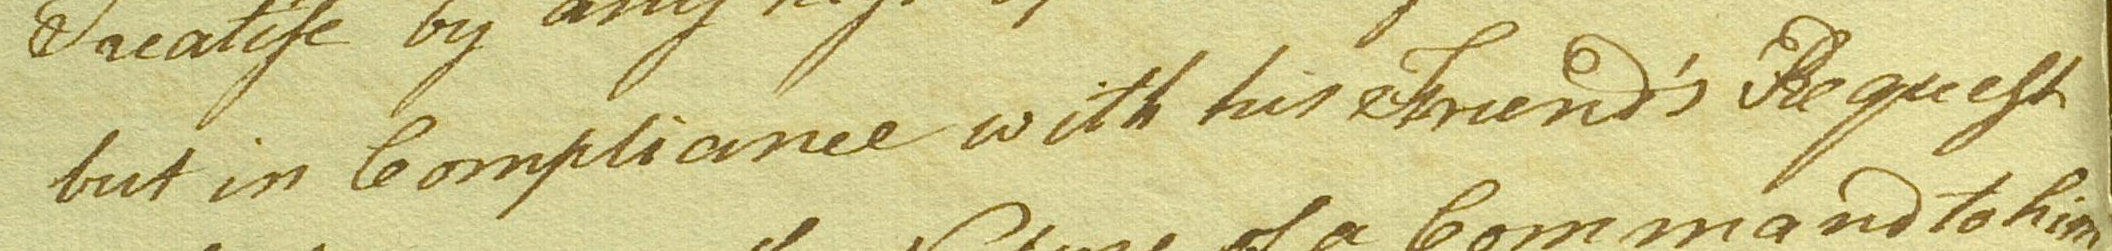but in Compliance with his Friend's Request
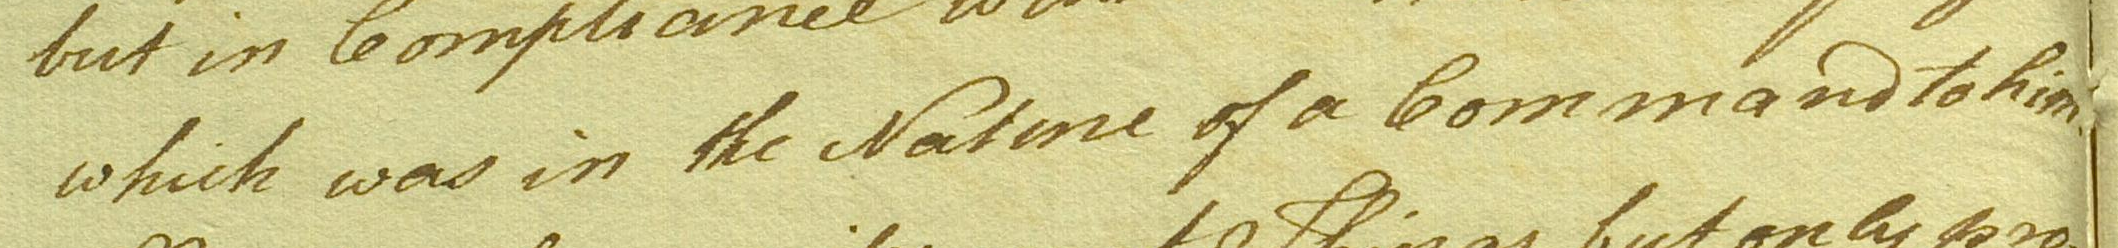which was in the Nature of a Command to him
